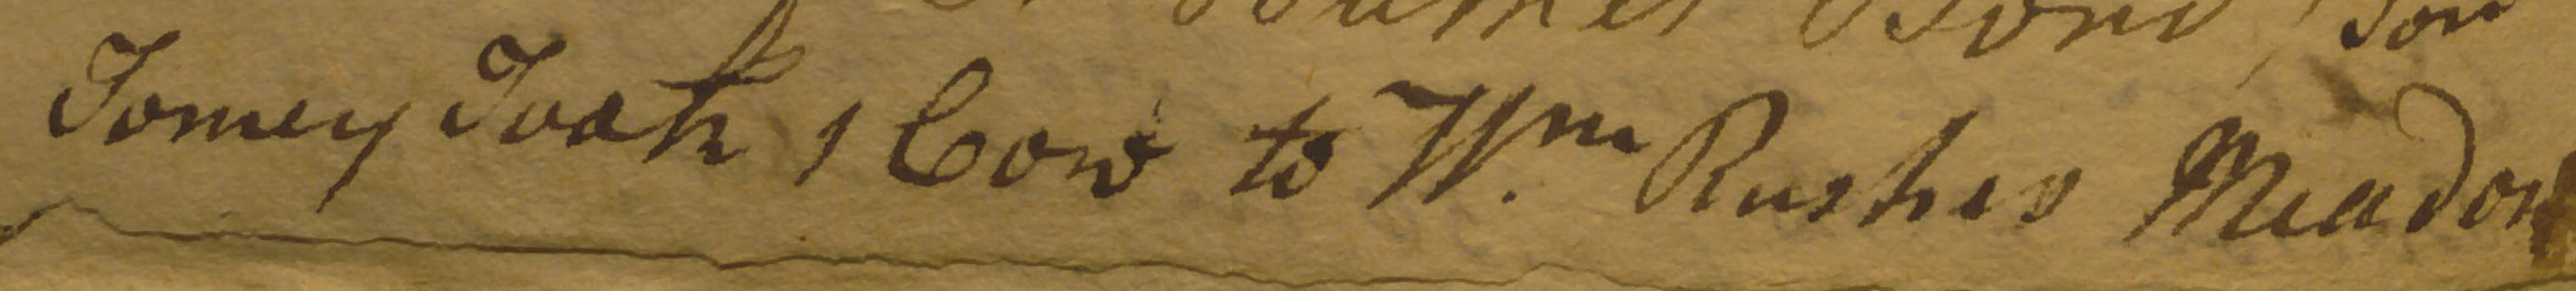Tomey Took 1 Cow to W^m. Rushes Meadow
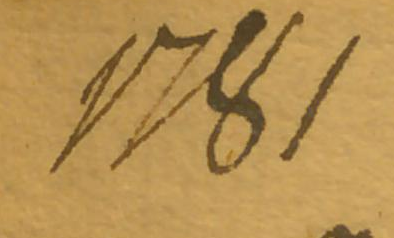1781
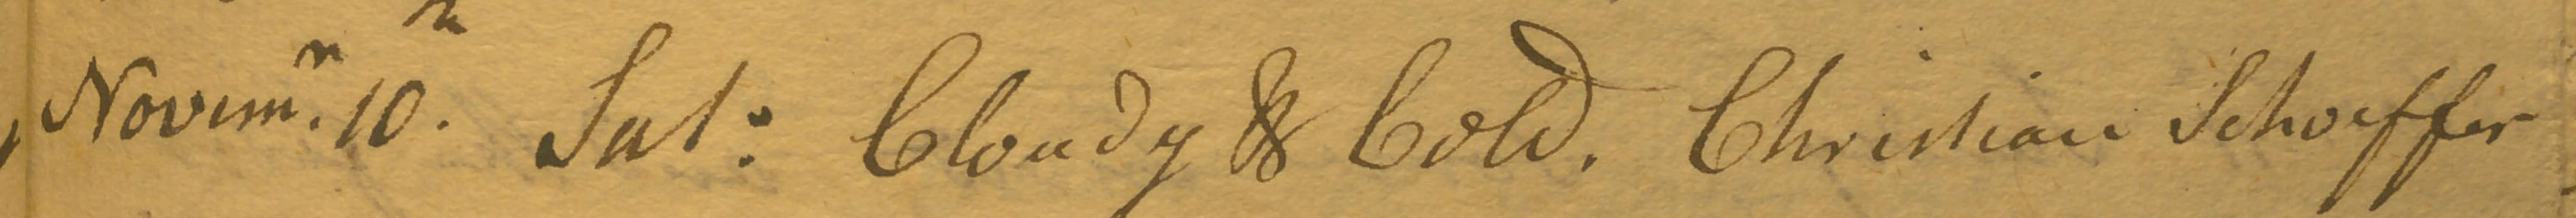Novem^r. 10^th. Sat: Cloudy & Cold. Christian Schoeffer
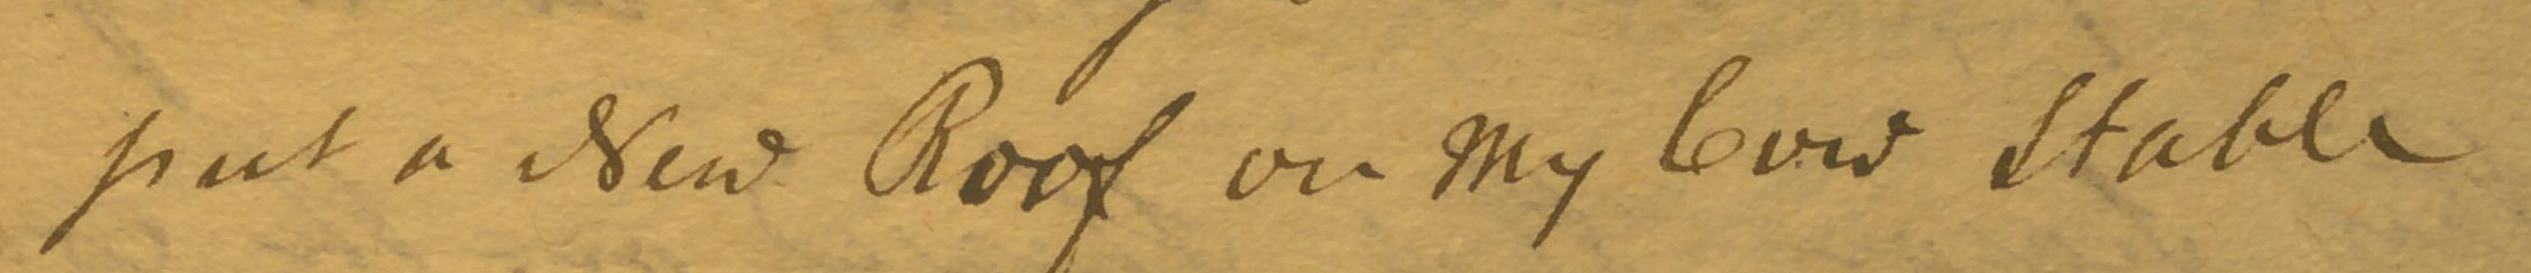put a New Roof on my Cow Stable
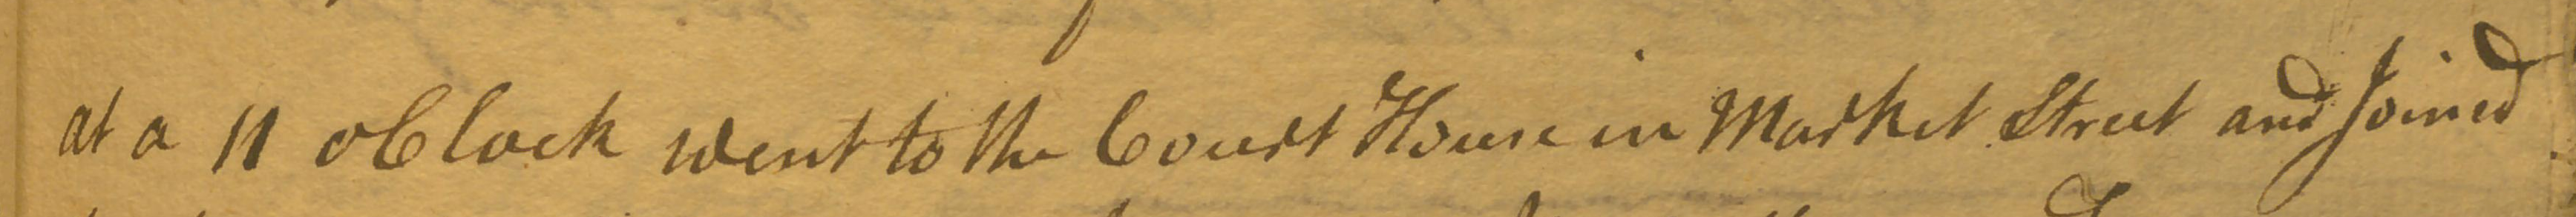at a 11 oClock went to the Court House in Market Street and Joined
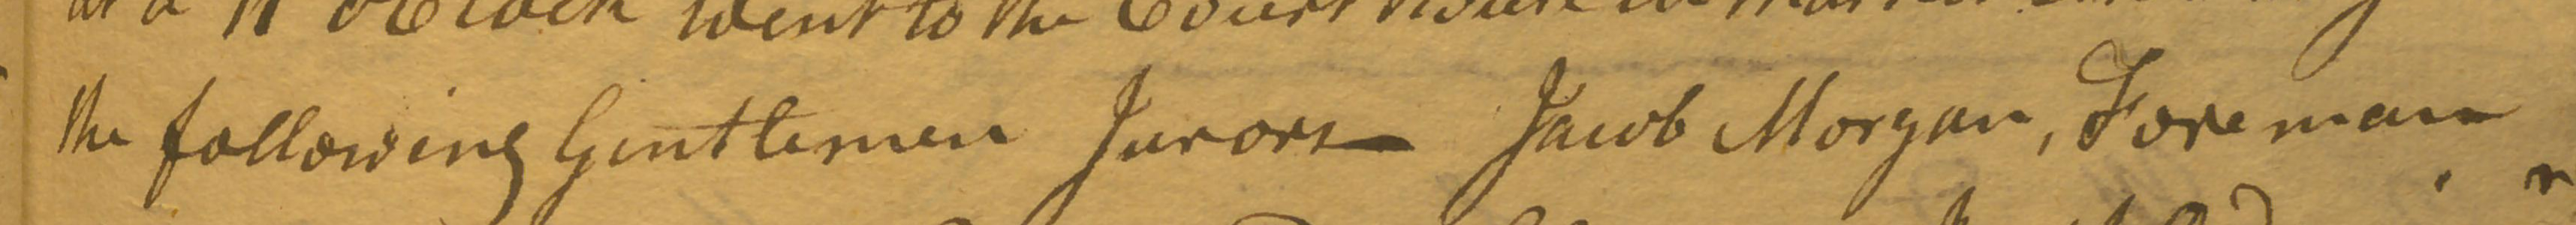the following Gentlemen Jurors Jacob Morgan, Foreman
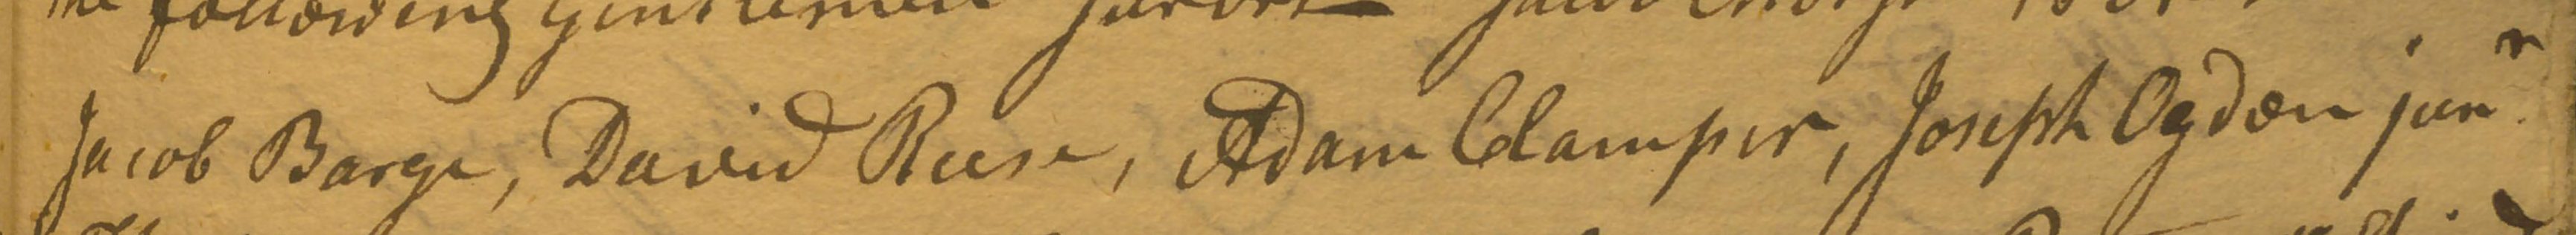Jacob Barge, David Reese, Adam Clamper, Joseph Ogdon jun^r.
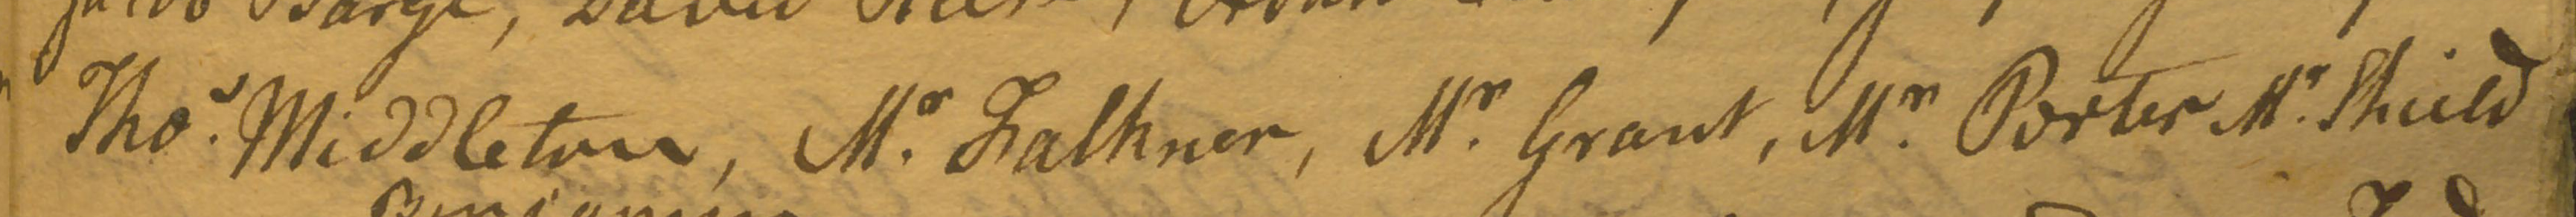Tho^s. Middleton, M^r. Falkner, M^r. Grant, M^r. Porter M^r. Shield
